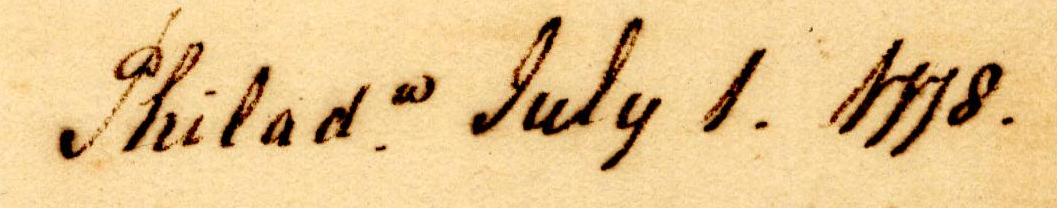Philad^a. July 1. 1778.
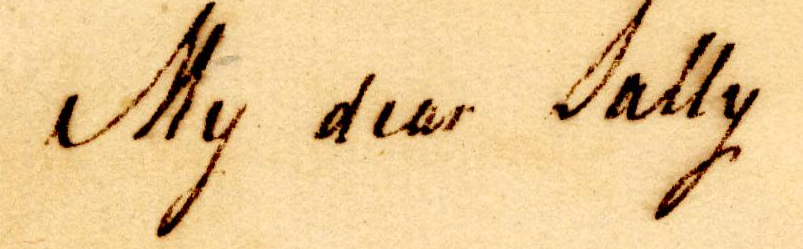My dear Sally
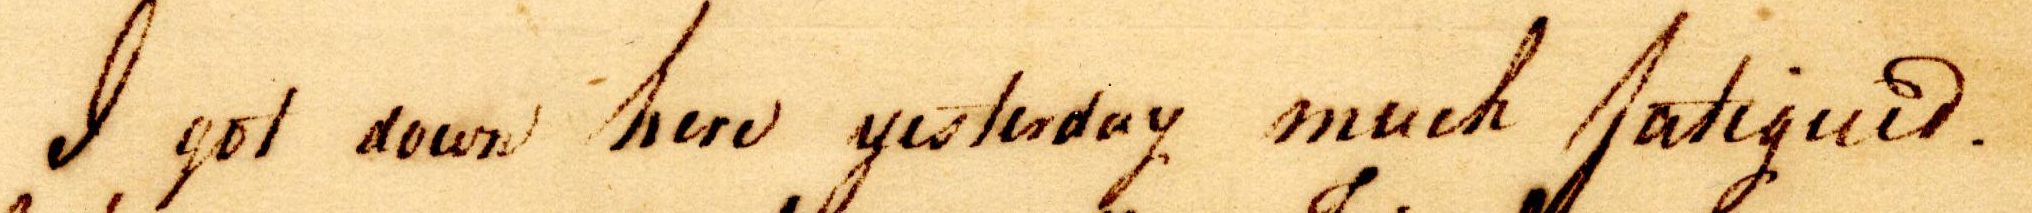I got down here yesterday much fatigued.
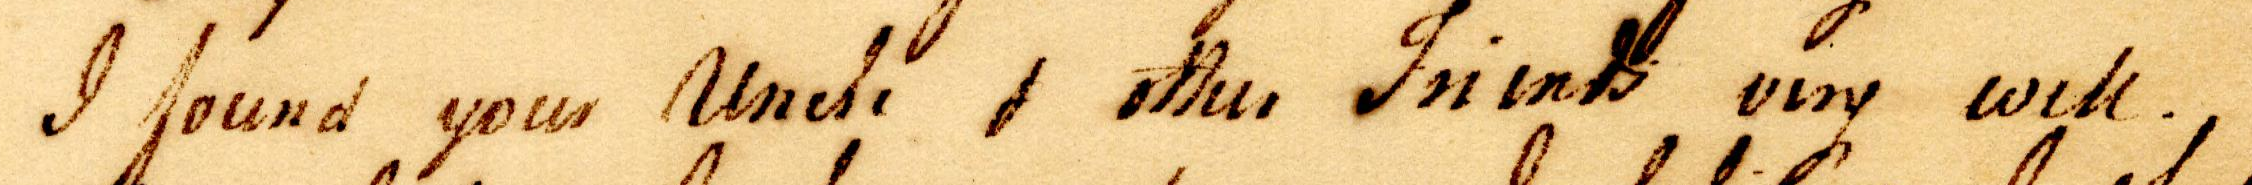I found your Uncle & other Friends very well.
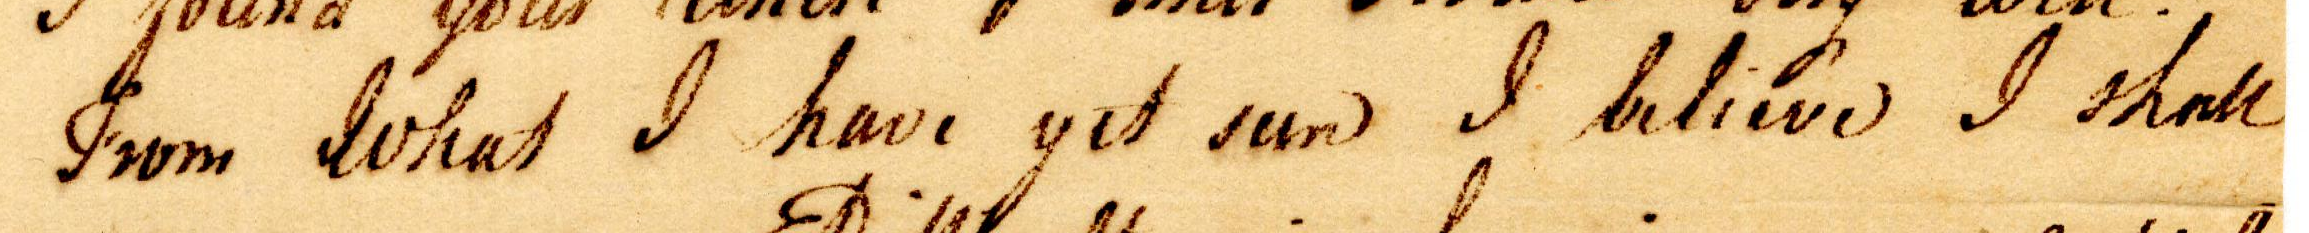From what I have yet seen I believe I shall
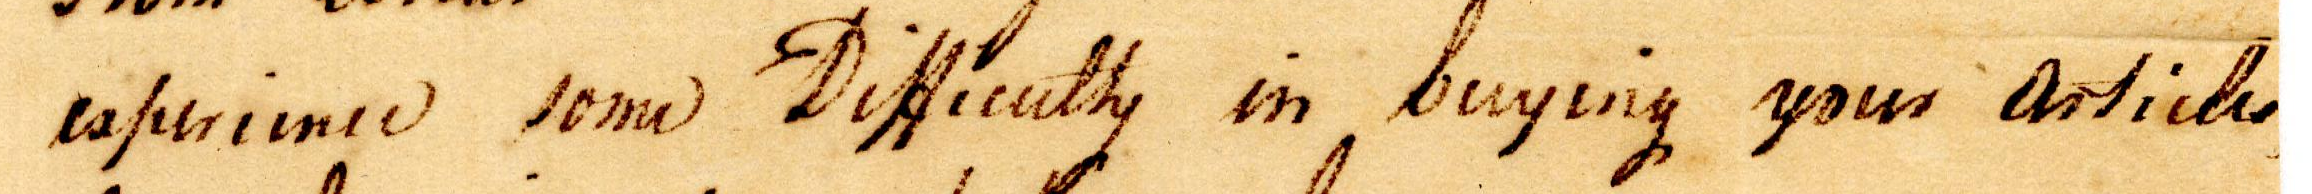experience some Difficulty in buying your Articles
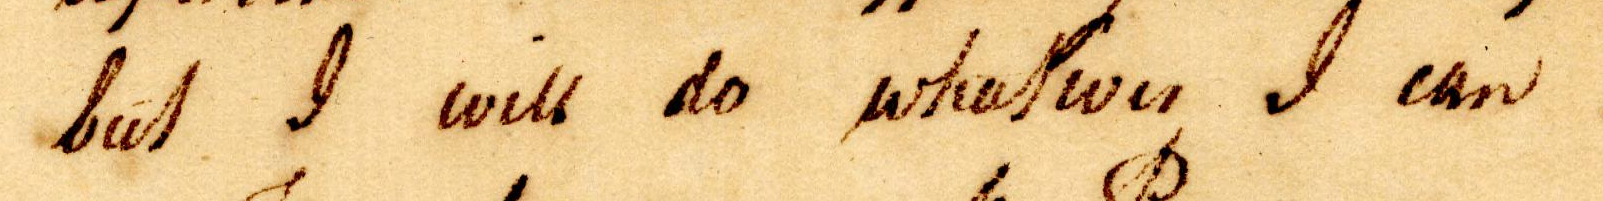but I will do whatever I can
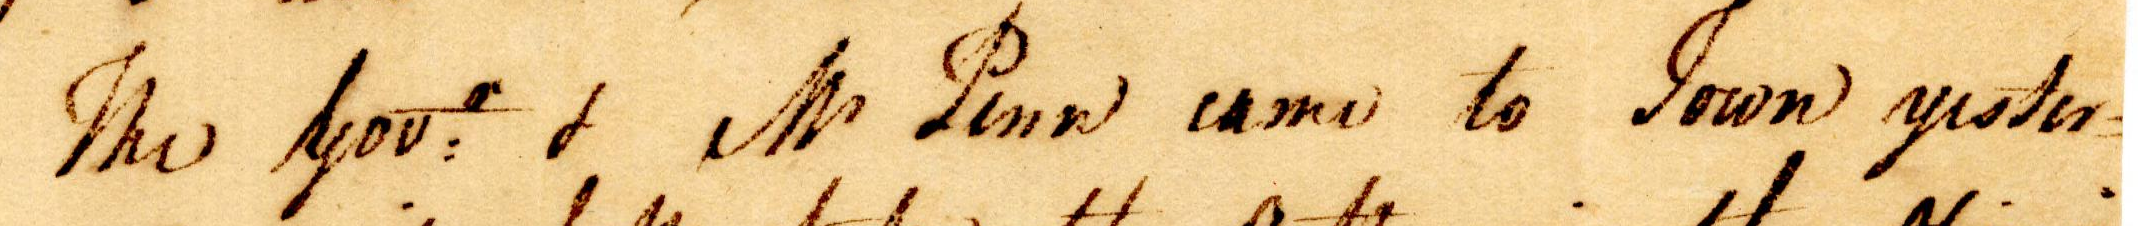The Gov^r & M^r Penn came to Town yester-
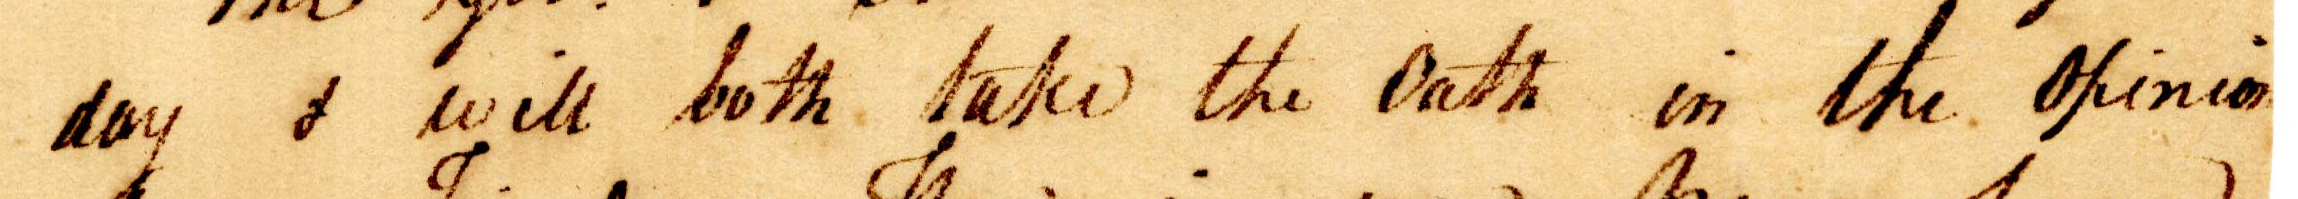-day & will both take the Oath in the Opinion
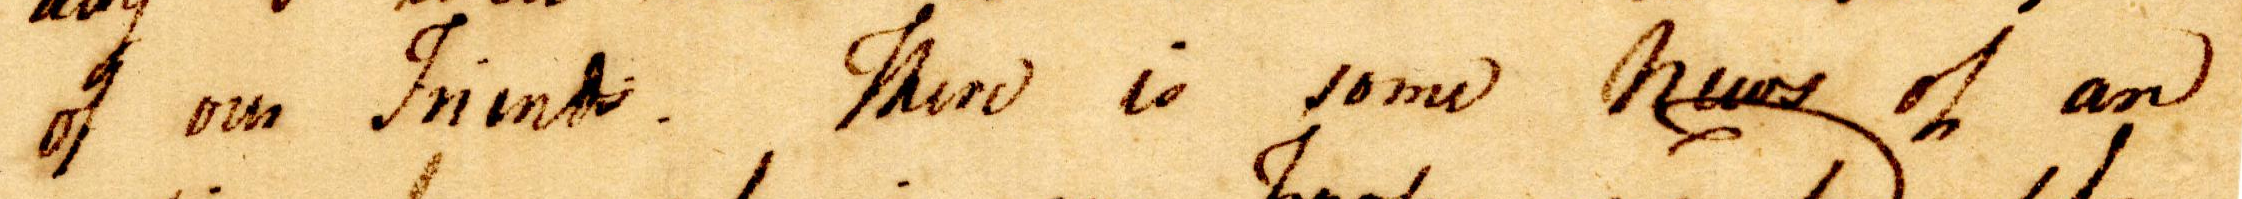of our Friends. There is some News of an
